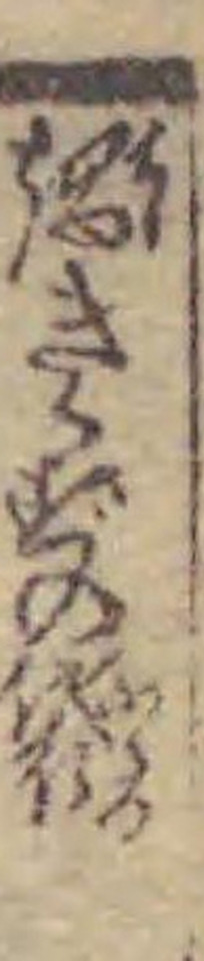端きらずの袋
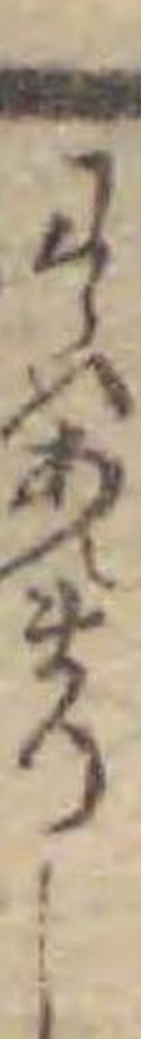わしはあんまり
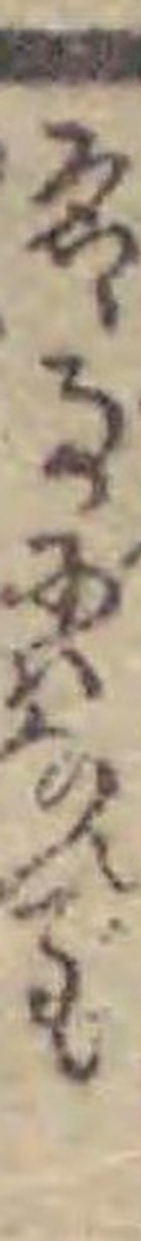ゑゝ事にはなんでも
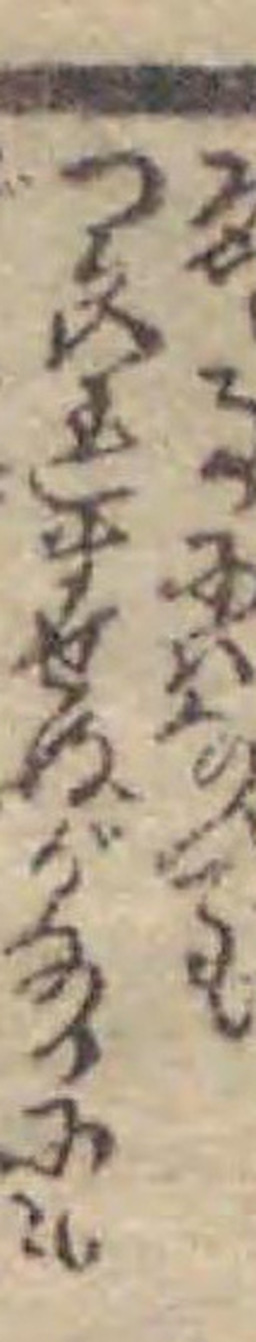つははれませぬがなかにも
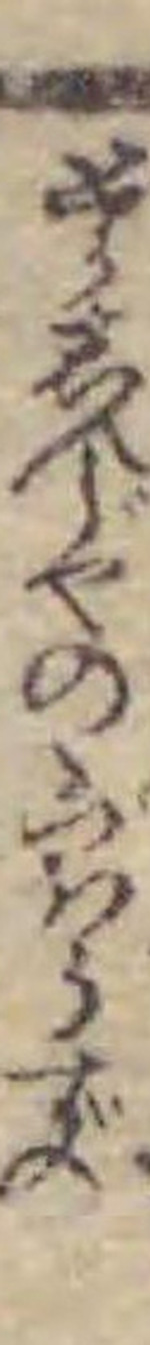どうしんじやの山ほうずの
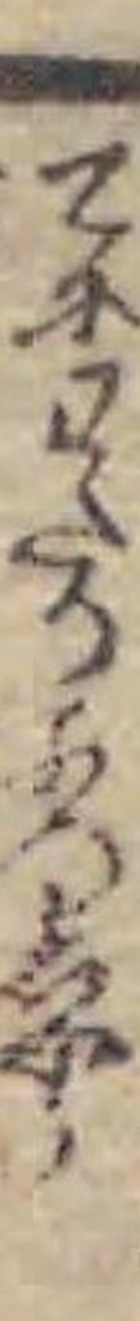てにわたりふつしやう
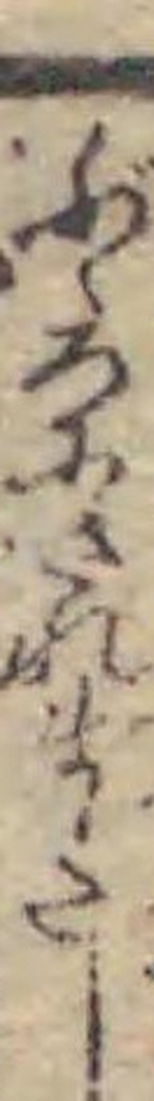ぶくろにされました
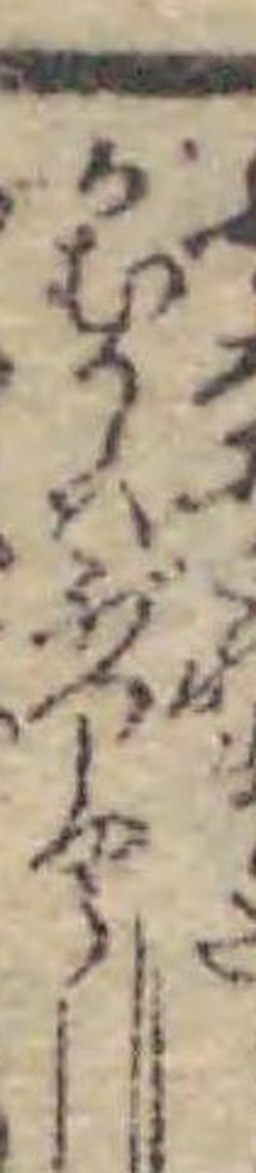かむかしはぶつしやう
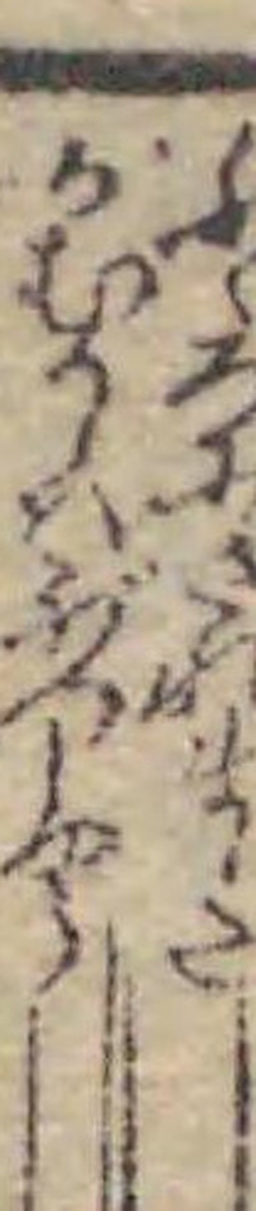かむかしはぶつしやう
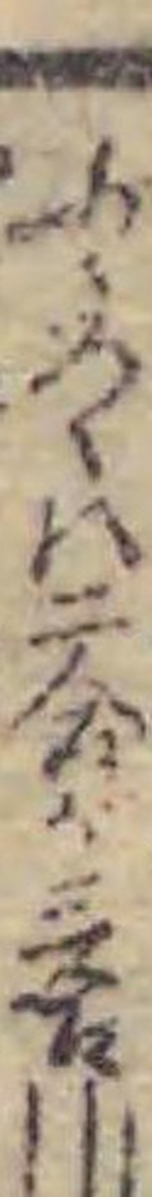ふくろは二合か三合
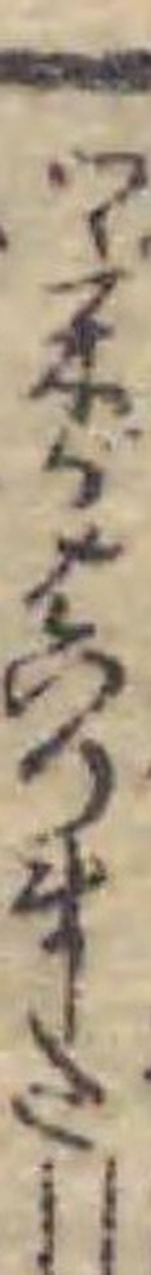ツヽ米がはいりました
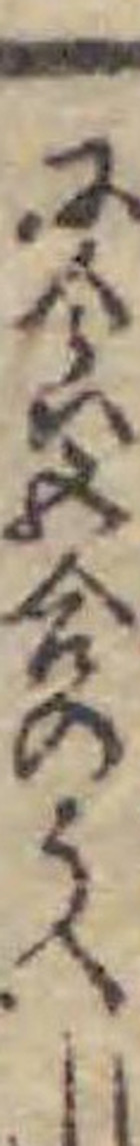に今は五合のうへ
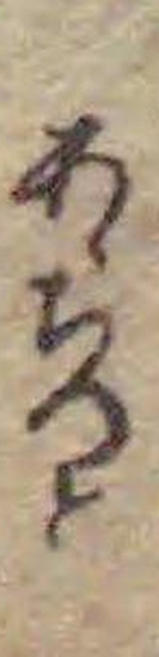あゝちつと
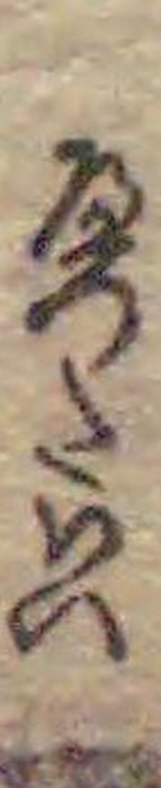へつたはい
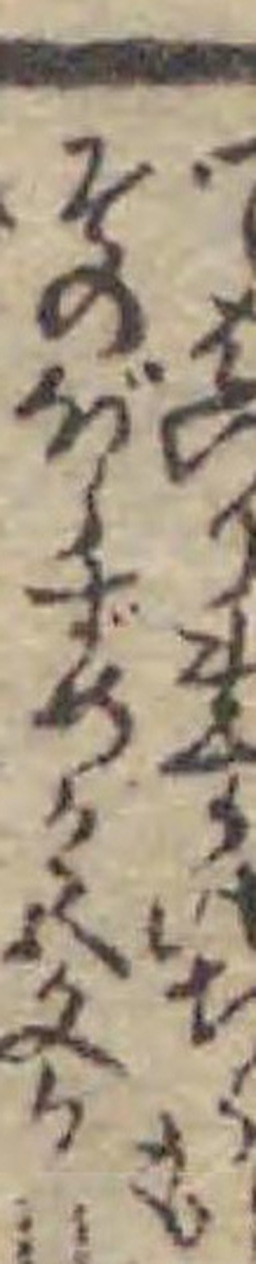そのぼうずめか五文か
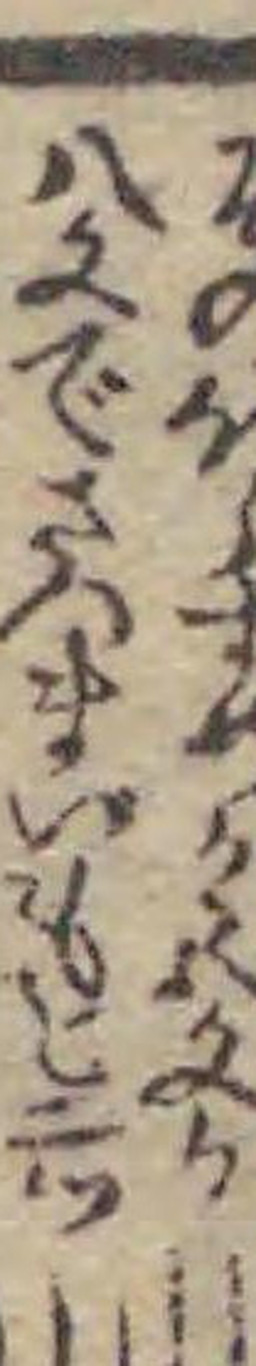八文でさつまいもを二ツ
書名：紙屑身上噺 : 3巻
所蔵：国立国会図書館 National Diet Library, JAPAN
